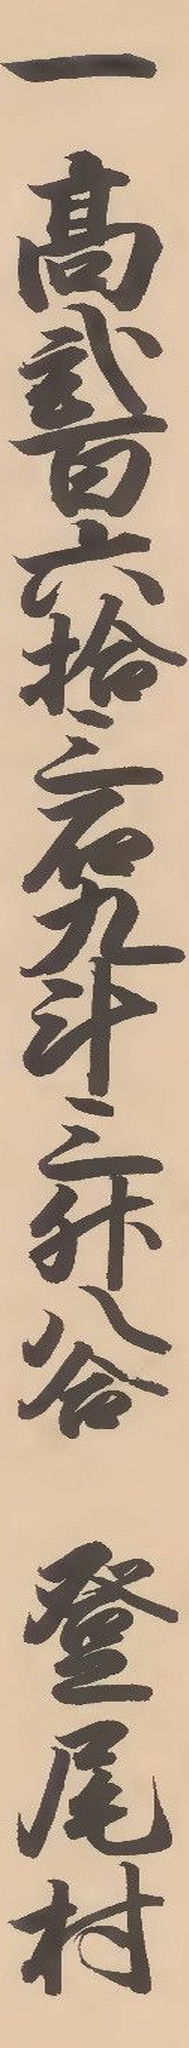一高弐百六拾三石九斗三升八合登尾村

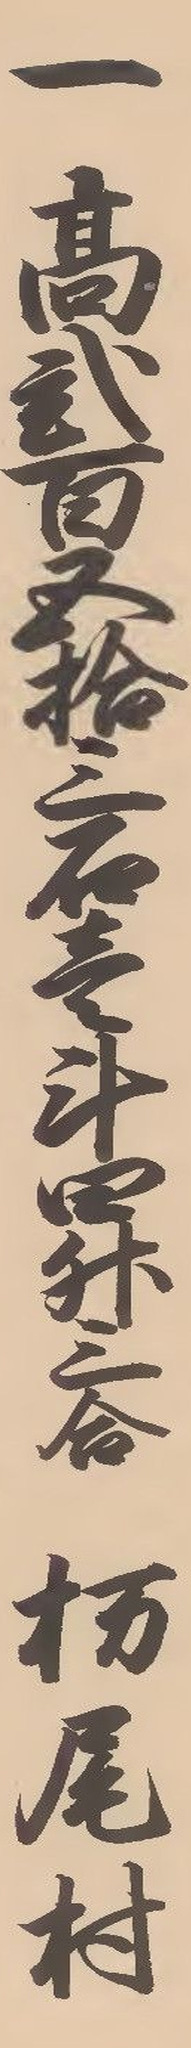一高弐百五拾三石壱斗四升三合栃尾村
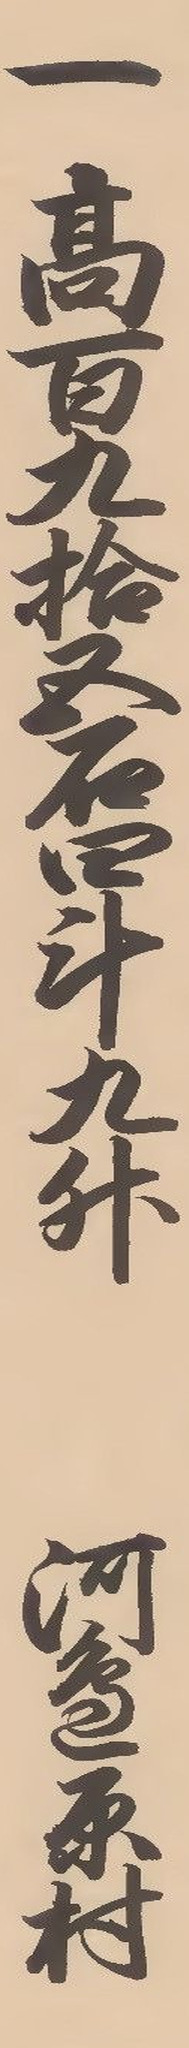一高百九拾五石四斗九升河辺原村
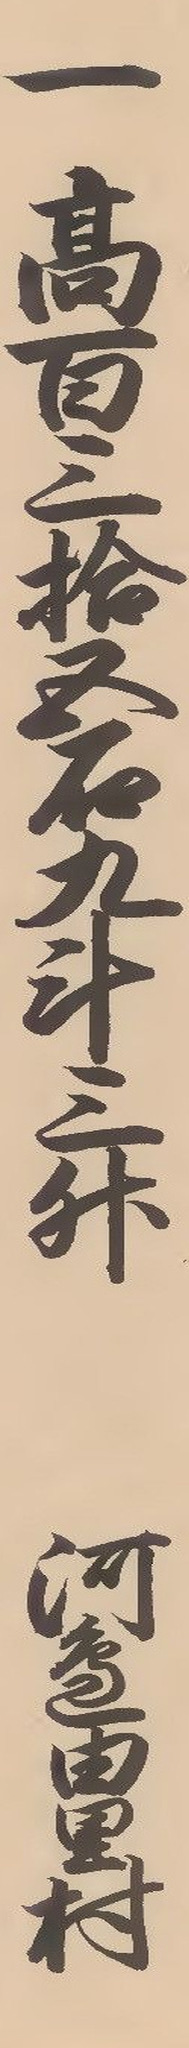一高百三拾五石九斗三升河辺由里村
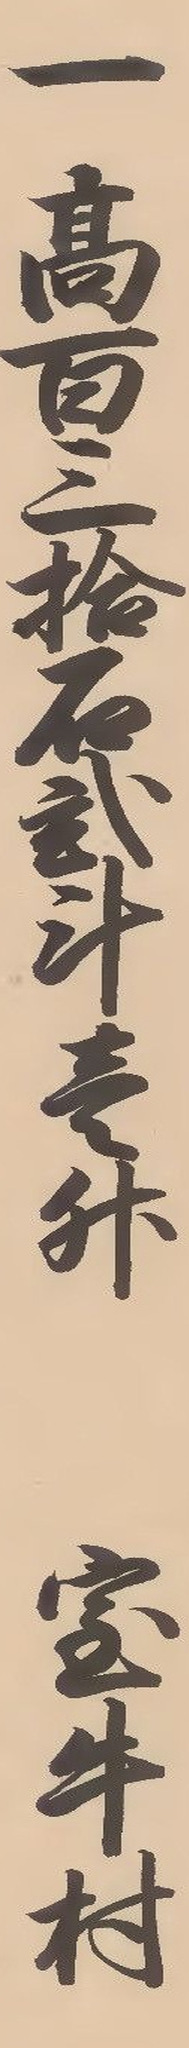一高百三拾石弐斗壱升室牛村
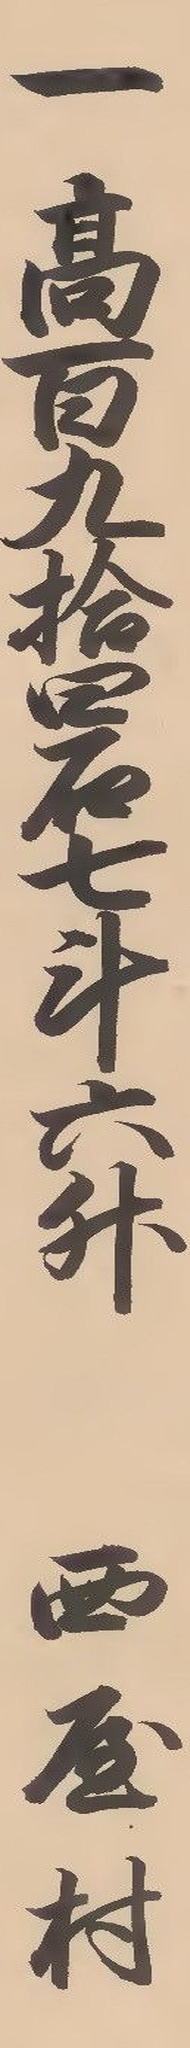一高百九拾四石七斗六升西屋村
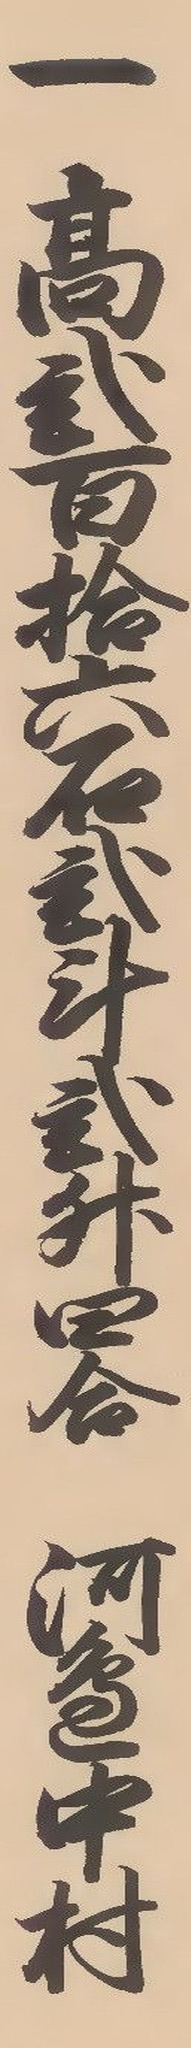一高弐百拾六石弐斗弐升四合河辺中村
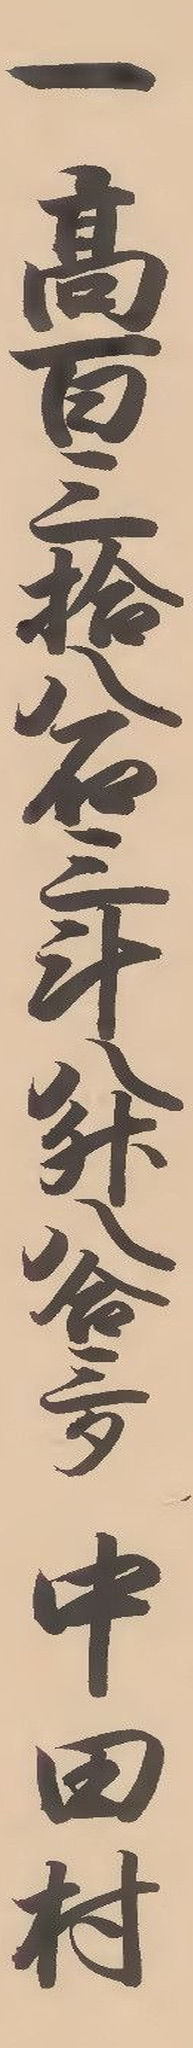一高百三拾八石三斗八升八合三勺中田村
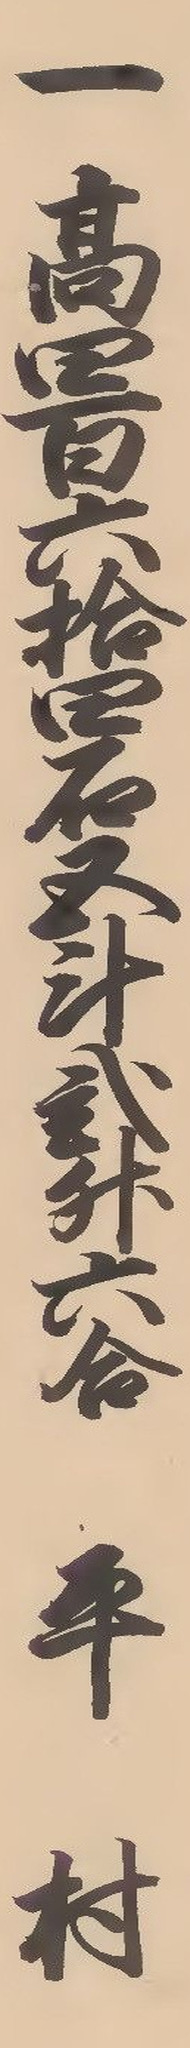一高四百六拾四石五斗弐升六合平村

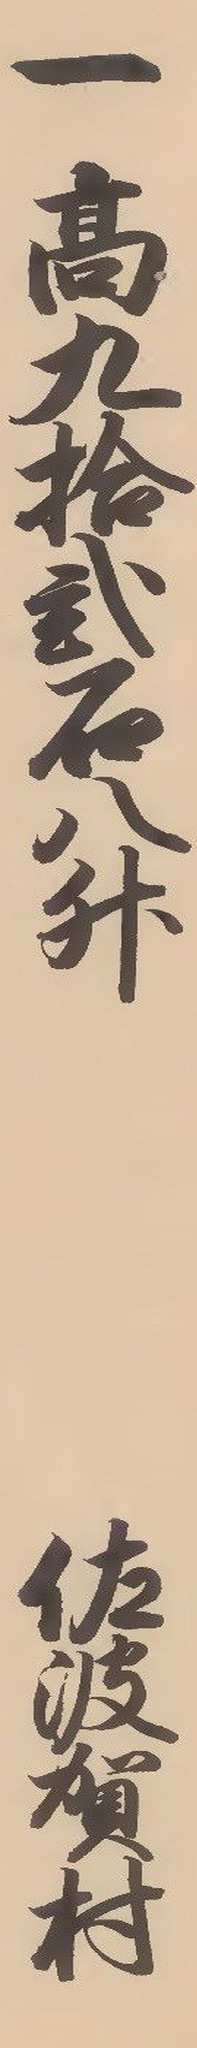一高九拾弐石八升佐波賀村
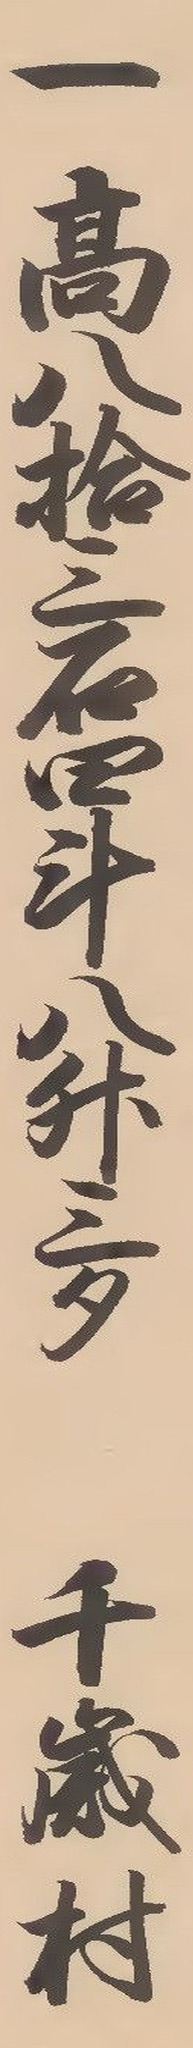一高八拾三石四斗八升三勺千歳村
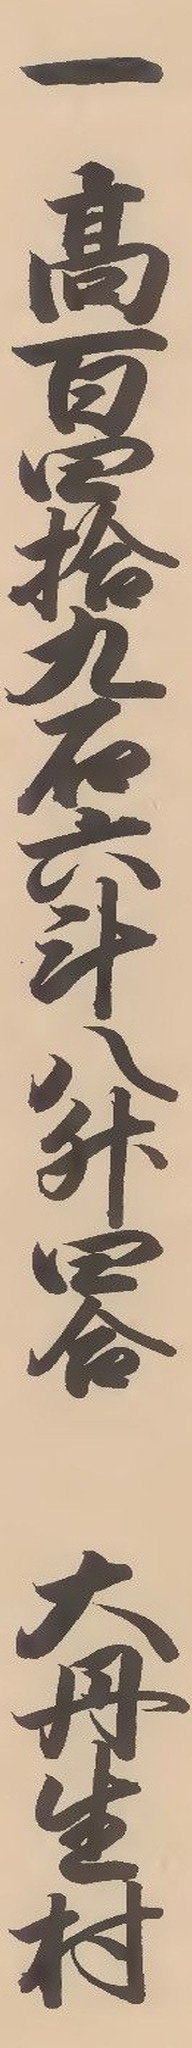一高百四拾九石六斗八升四合大丹生村
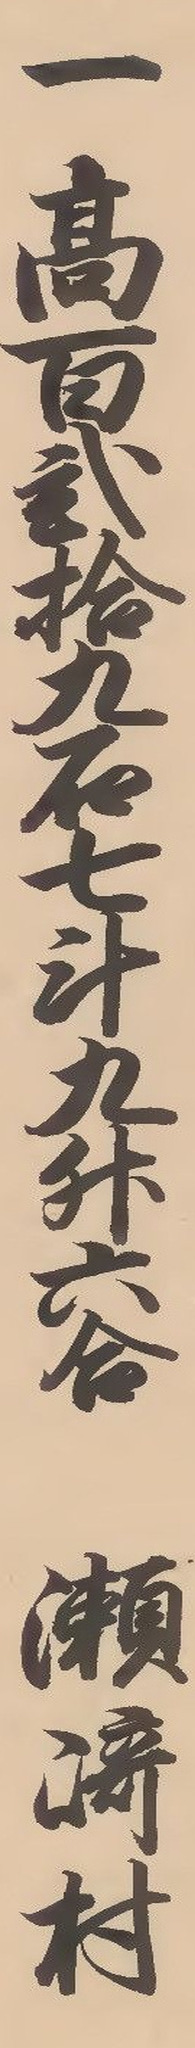一高百弐拾九石七斗九升六合瀬崎村
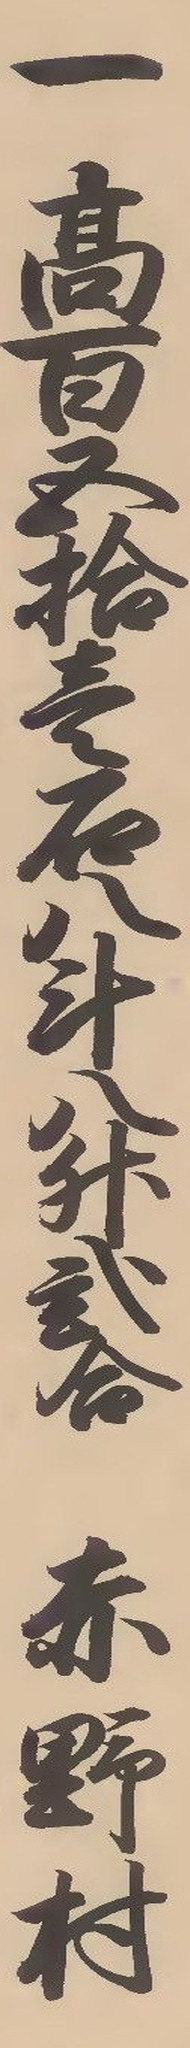一高百五拾壱石八斗八升弐合赤野村
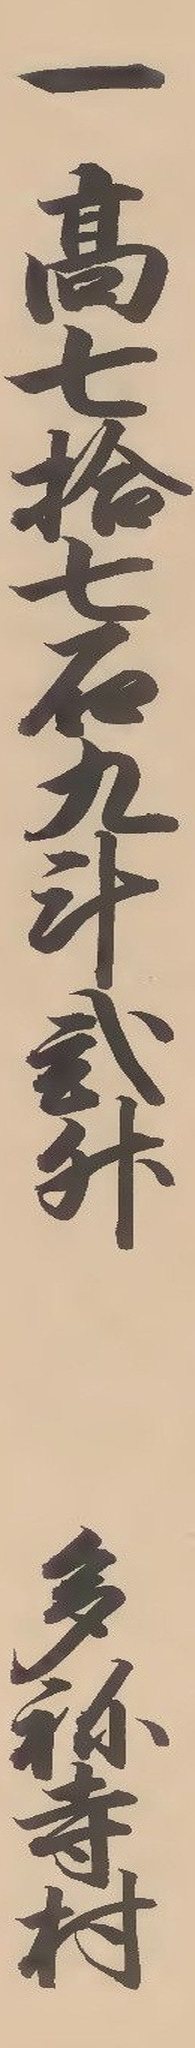一高七拾七石九斗弐升多祢寺村
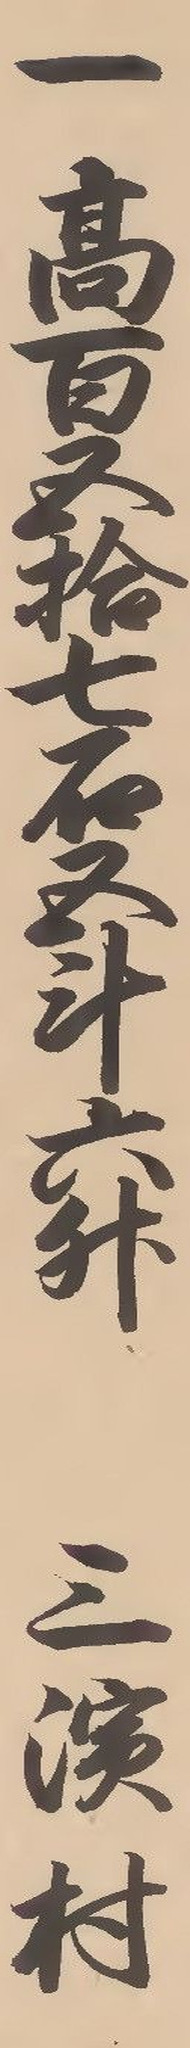一高百五拾七石五斗六升三浜村
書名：丹後国郷帳
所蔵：国立公文書館 National Archives of Japan
